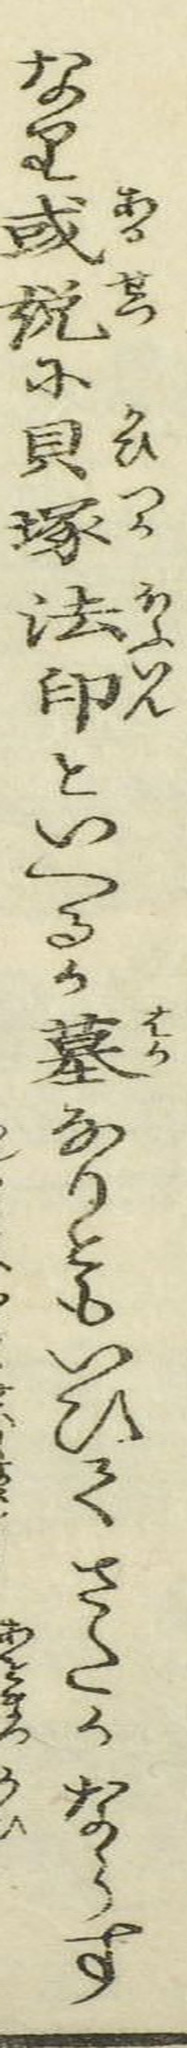なり或説に貝塚法印といへる墓なりともいひてさたかならす
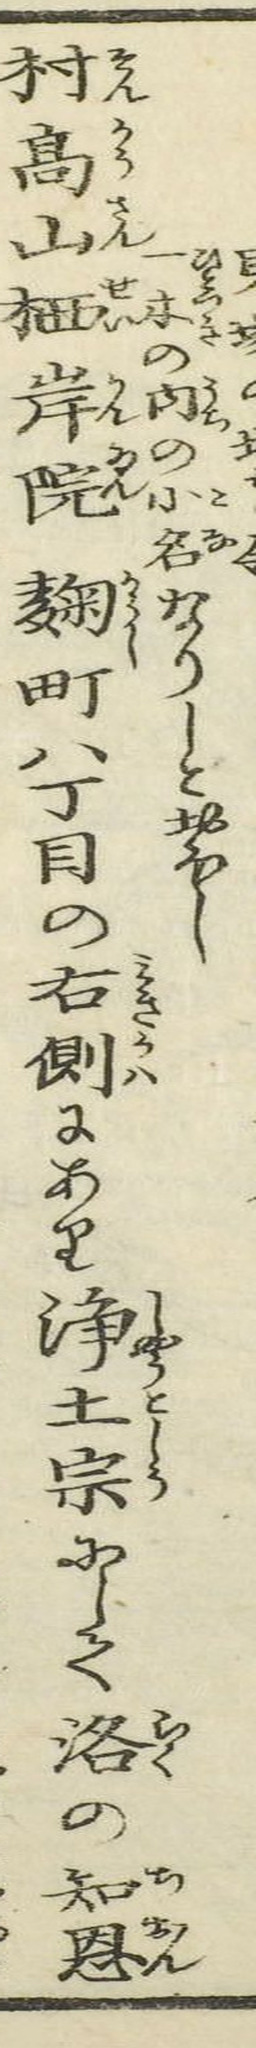村髙山栖岸院麹町八丁目の右側にあり浄土宗にして洛の知恩
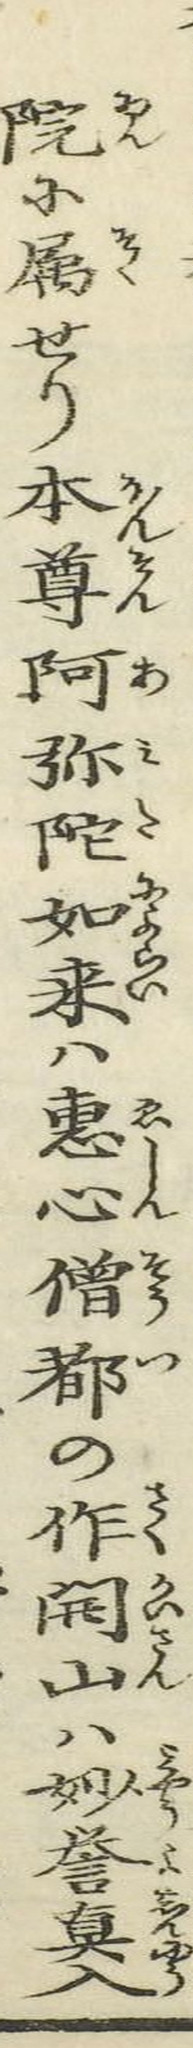院に属せり本尊阿弥陀如来は恵心僧都の作開山は妙誉真入
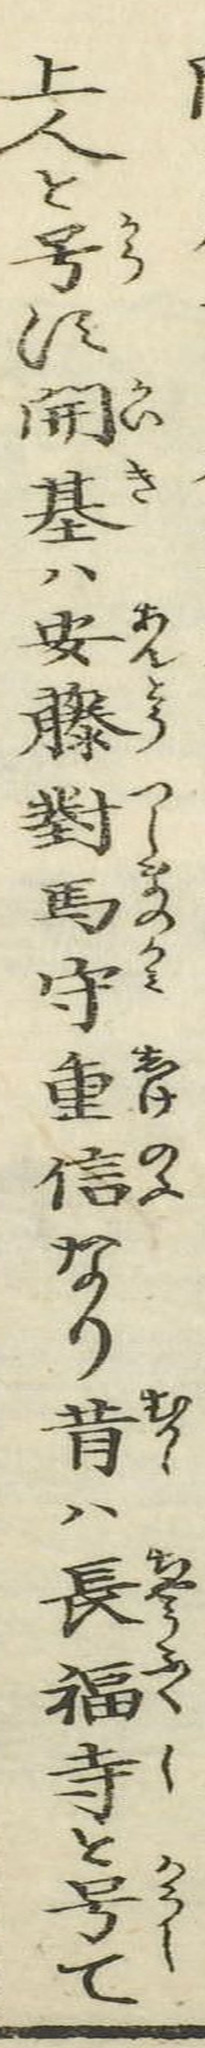上人と号す開基は安藤對馬守重信なり昔は長福寺と号て
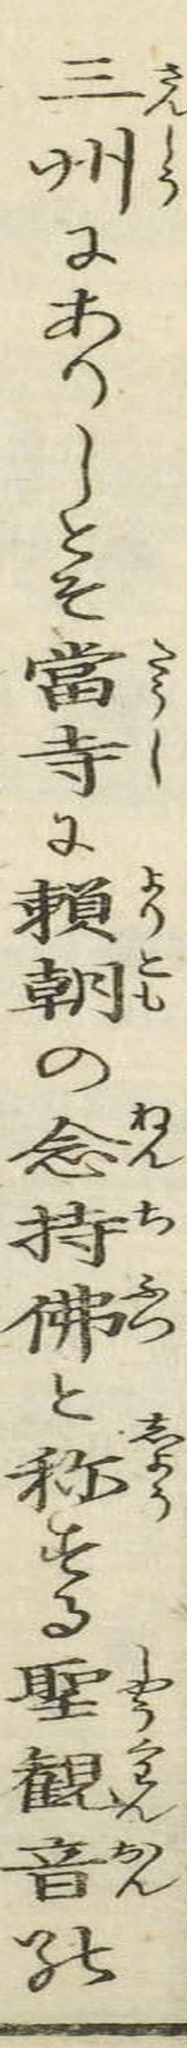三州にありしとそ當寺に頼朝の念持佛と称する聖観音の
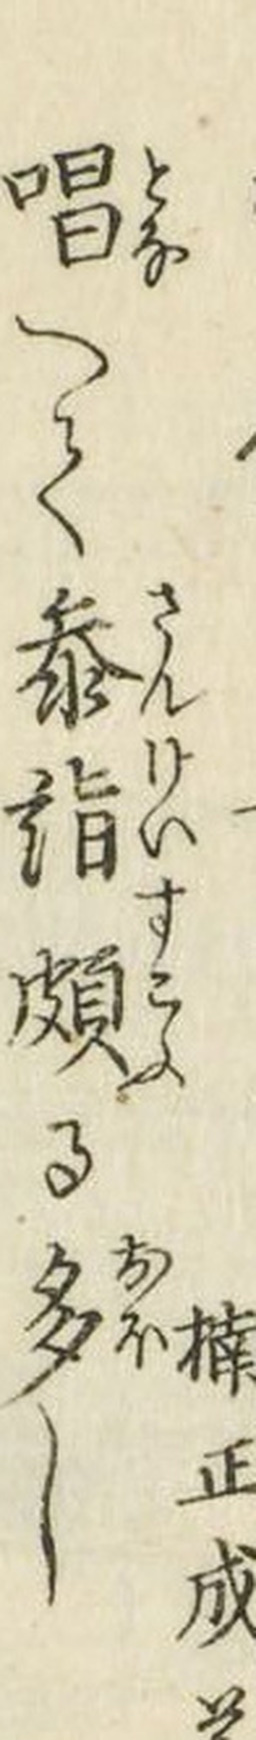唱へて参詣頗る多し
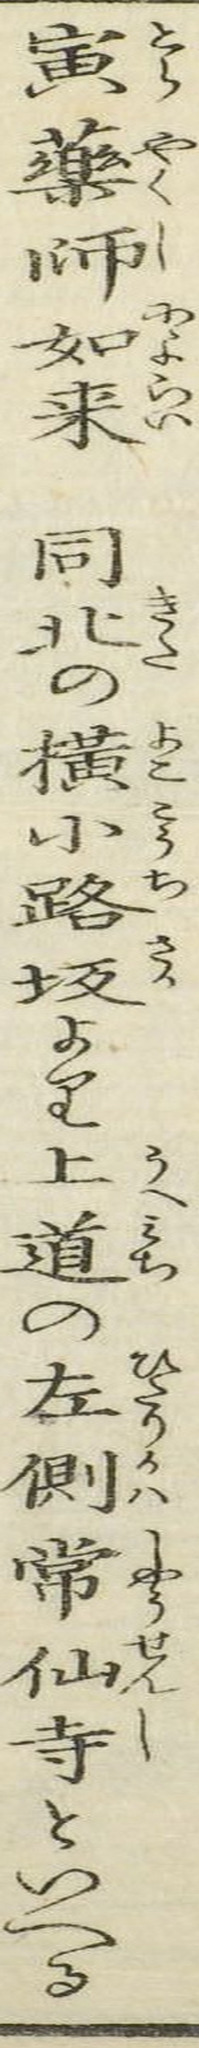寅藥師如来同北の横小路坂より上道の左側常仙寺といへる
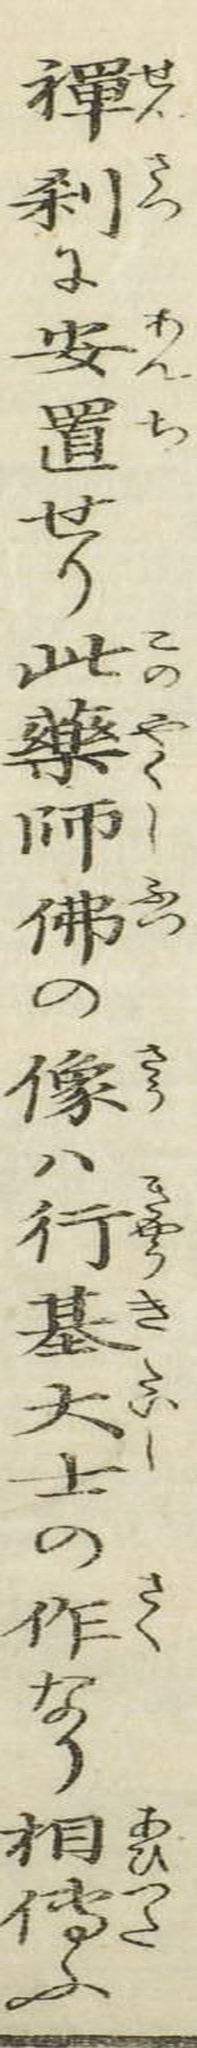禪刹に安置せり此藥師佛の像は行基大士の作なり相傳ふ
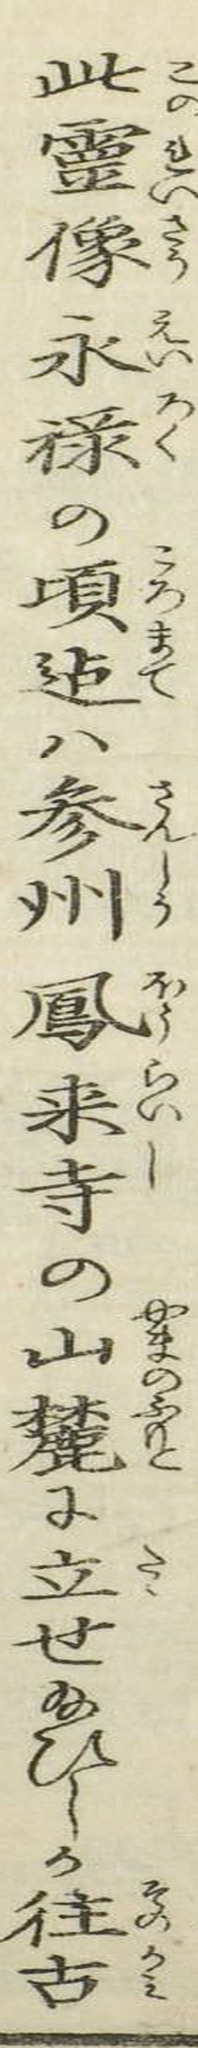此靈像永禄の頃迠は参州鳳来寺の山麓に立せ給ひしか往古
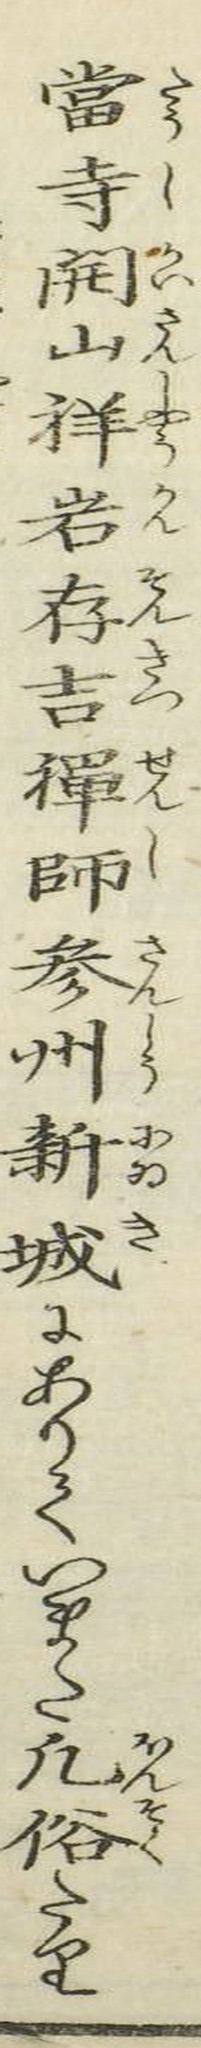當寺開山祥岩存吉禪師参州新城にありていまた凡俗たり
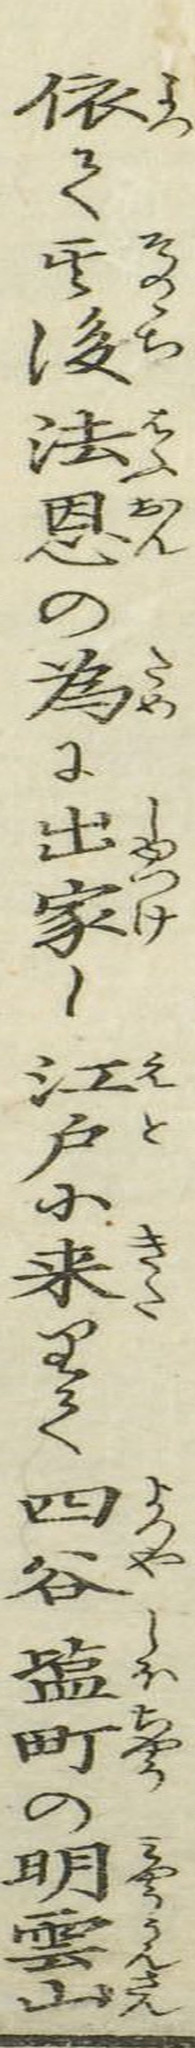依て其後法恩の為に出家し江戸に来りて四谷塩町の明雲山
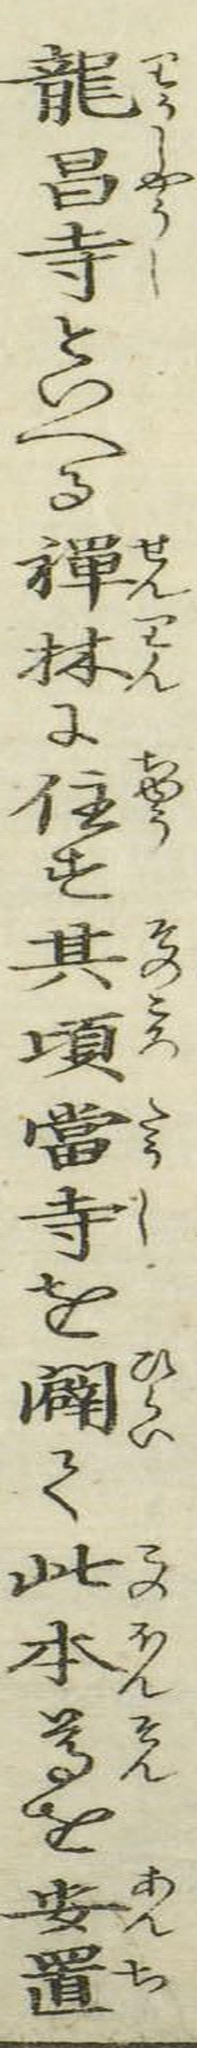龍昌寺といへる禪林に住す其頃當寺を闢て此本尊を安置
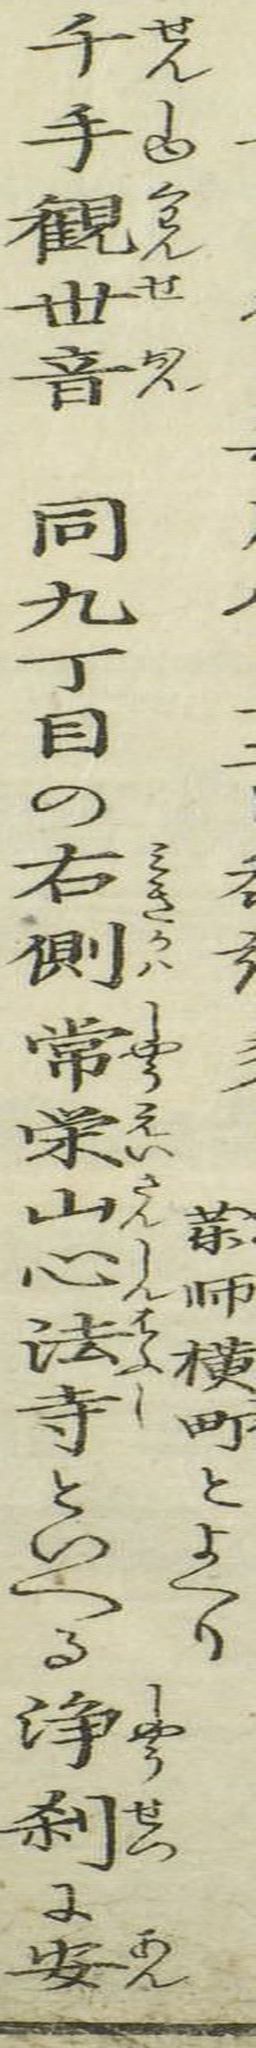千手観世音同九丁目の右側常栄山心法寺といへる浄刹に安

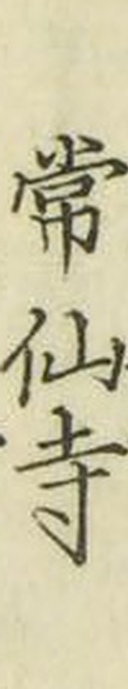常仙寺
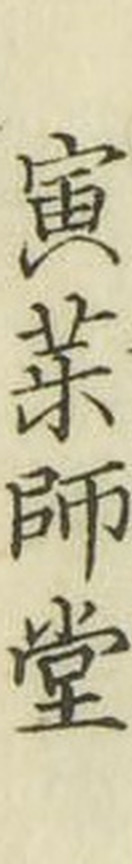寅薬師堂
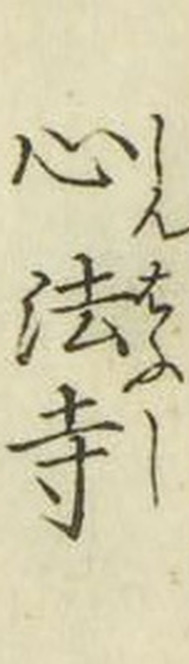心法寺
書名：江戸名所図会 20巻 巻之7
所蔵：東京学芸大学教育コンテンツアーカイブ
